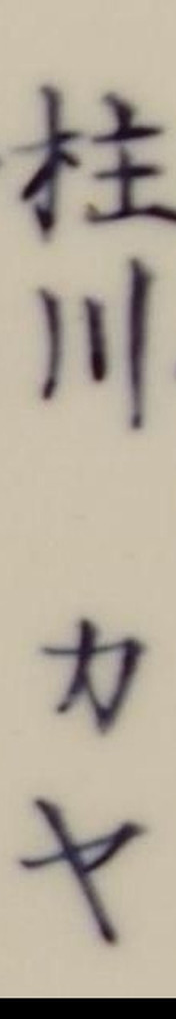桂川カヤ
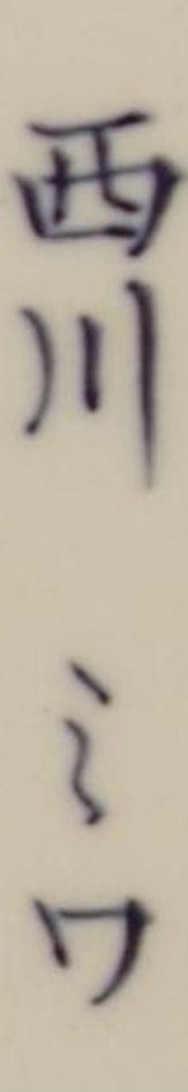西川ミワ
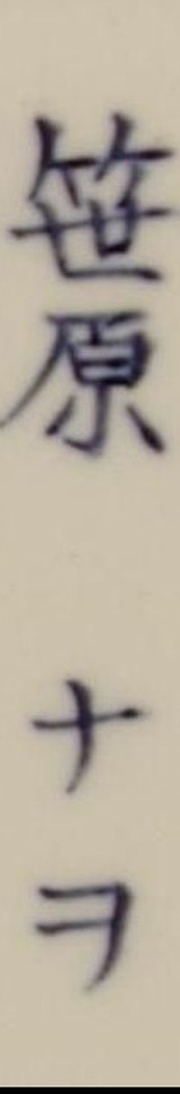笹原ナヲ
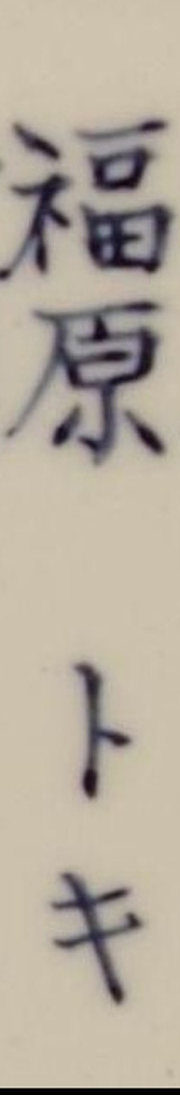福原トキ
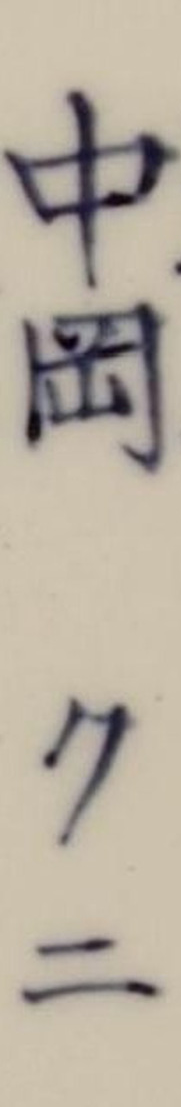中岡クニ
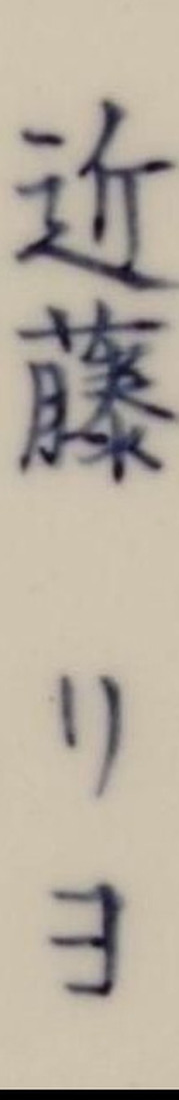近藤リヨ
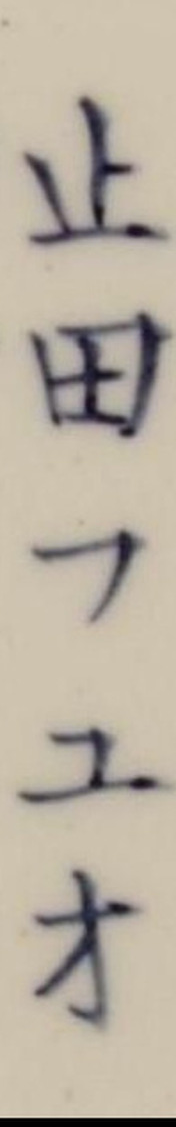止田フユオ
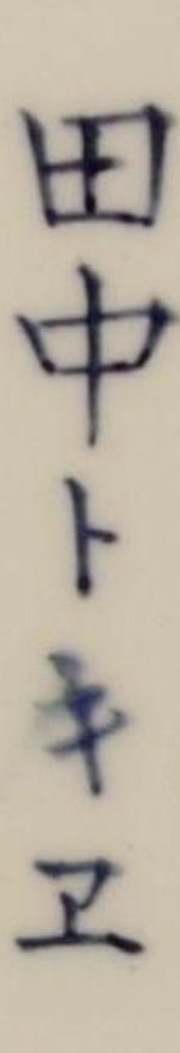田中トキヱ
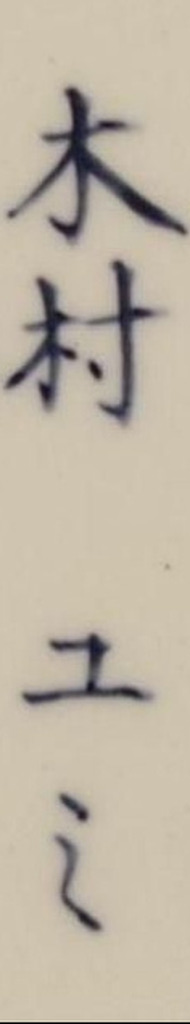木村ユミ
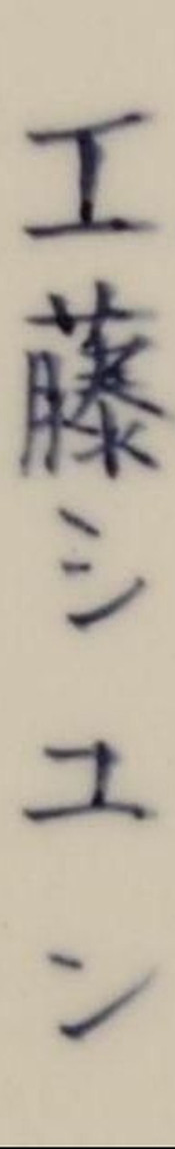工藤シユン
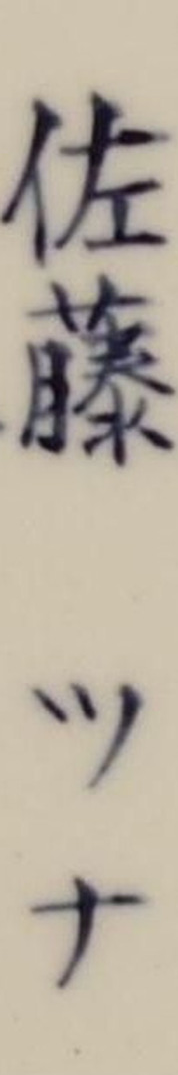佐藤ツナ
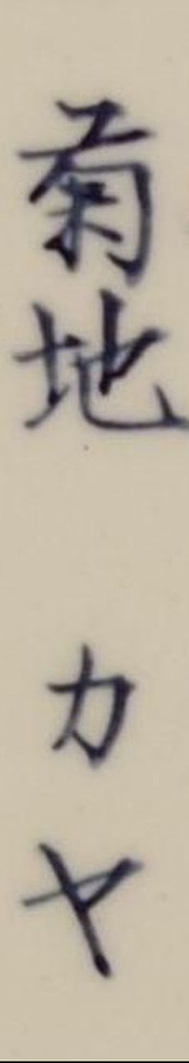菊地カヤ
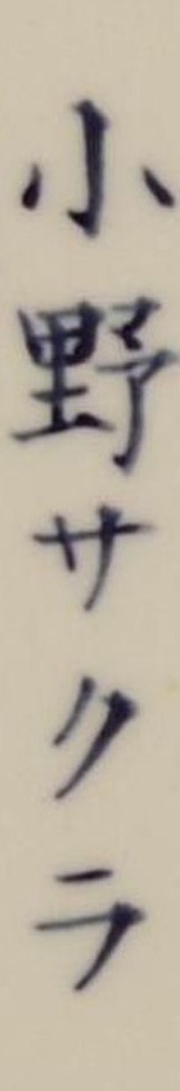小野サクラ
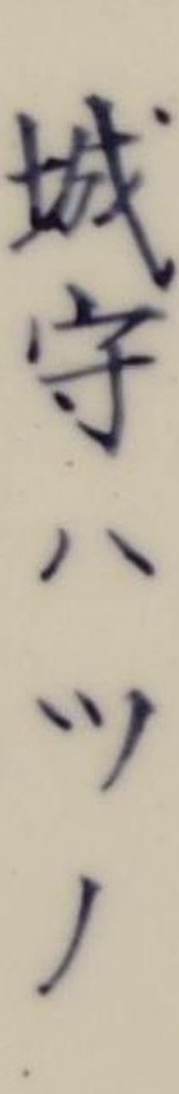城守ハツノ
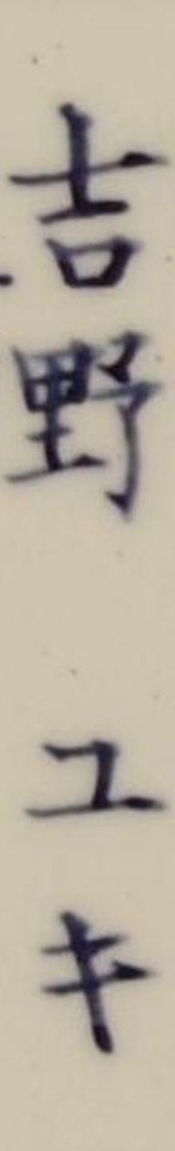吉野ユキ
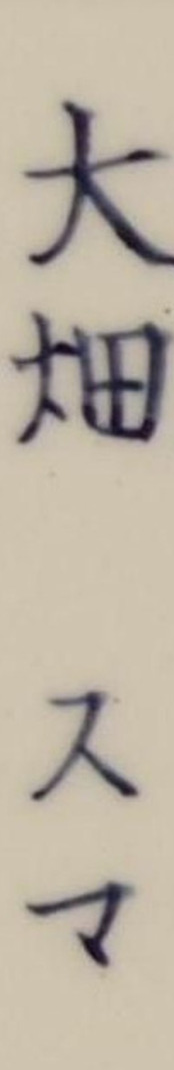大畑スマ
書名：E~L
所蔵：高野山金剛峯寺
